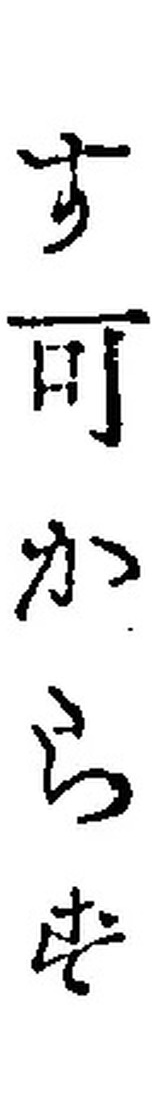す可からず
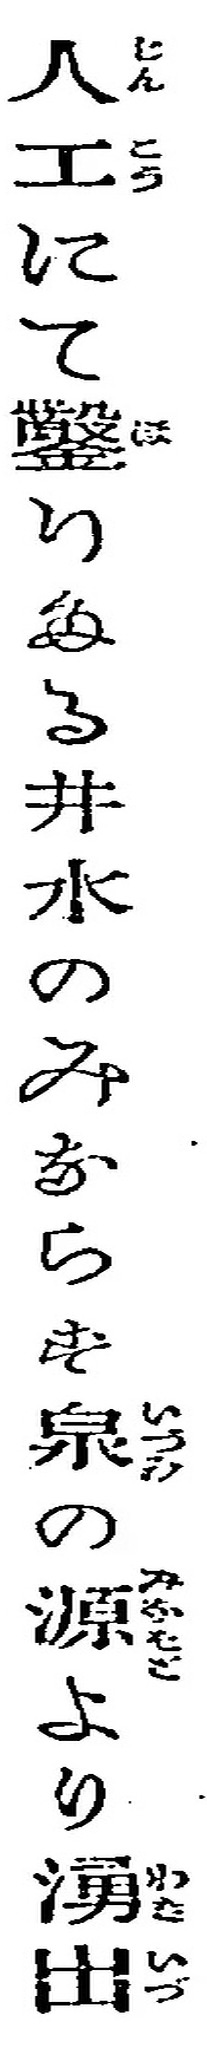人工にて鑿りたる井水のみならず泉の源より湧出
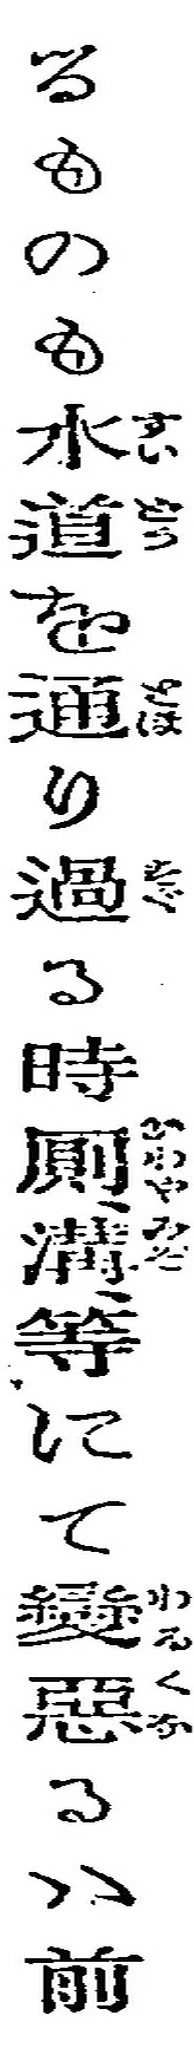るものも水道を通り過る時厠、溝、等にて變惡るは前
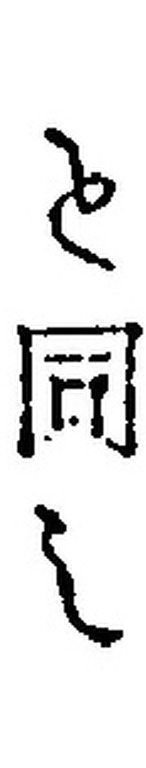と同し
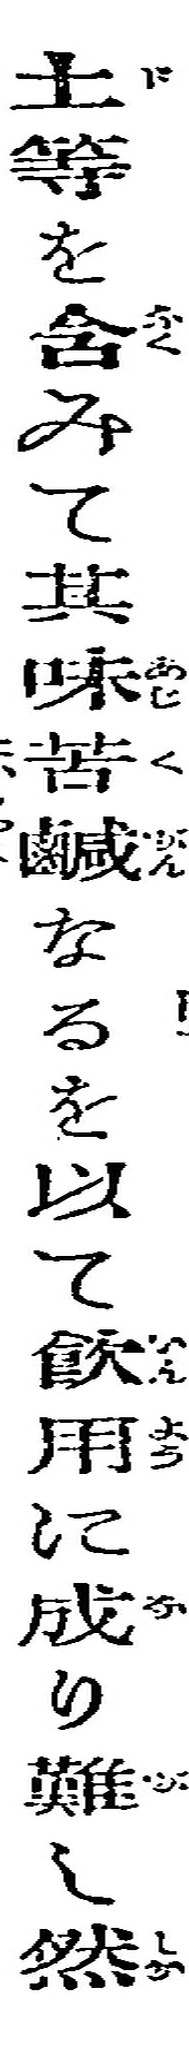土、等を含みて其味苦鹹なるを以て飲用に成り難し然
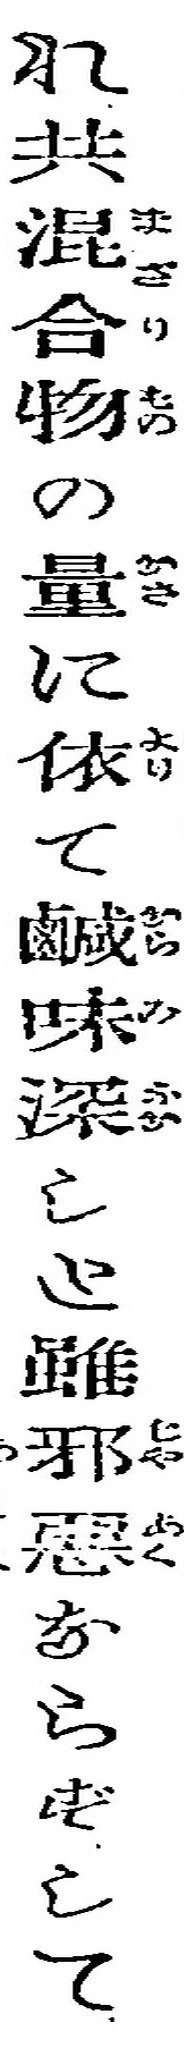れ共混合物の量に依て鹹味深しと雖邪悪ならずして
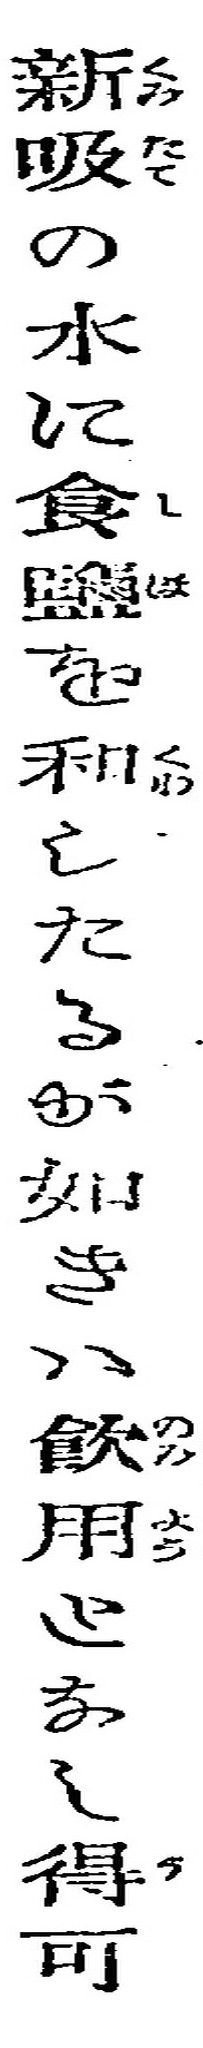新吸の水に食鹽を和したるが如きは飲用となし得可
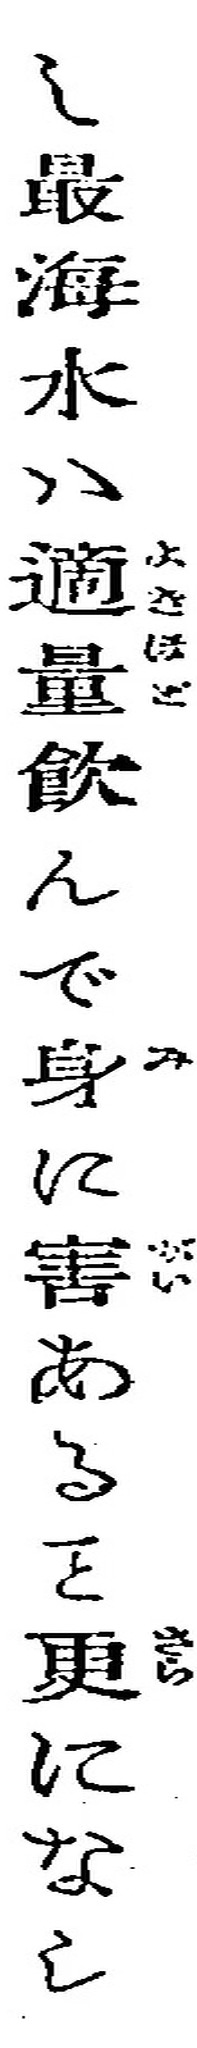し最海水は適量飲んで身に害あること更になし
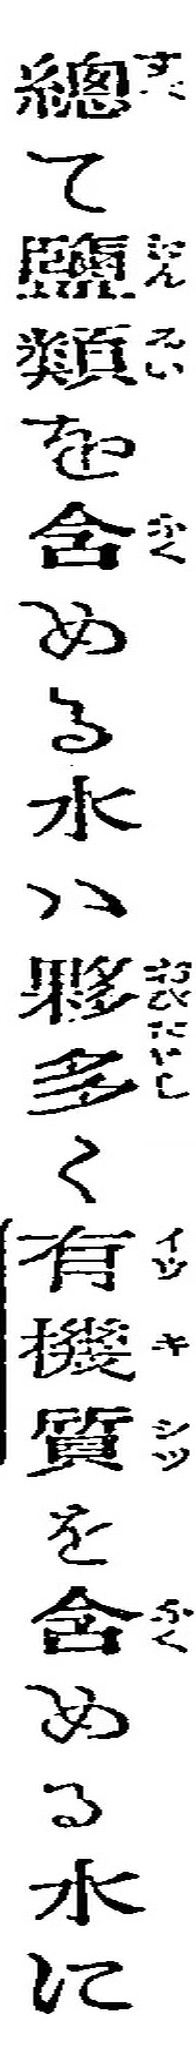総て鹽類を含める水は夥多く有機質を含める水に
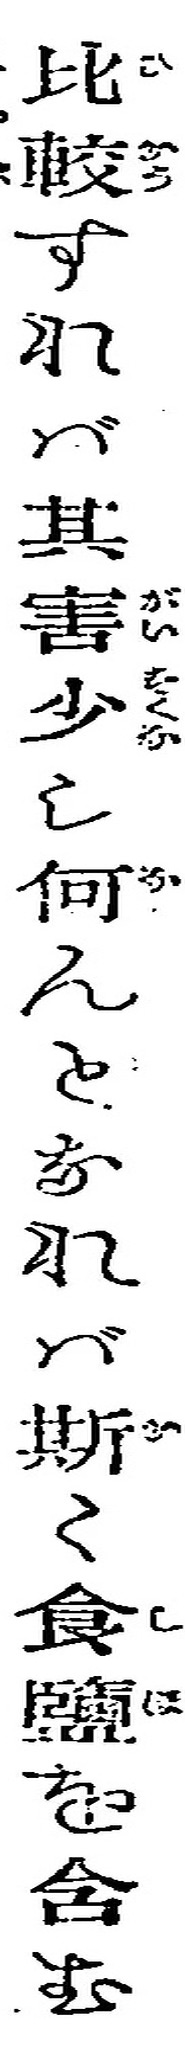比較すれば其害少し何んとなれば斯く食鹽を含む
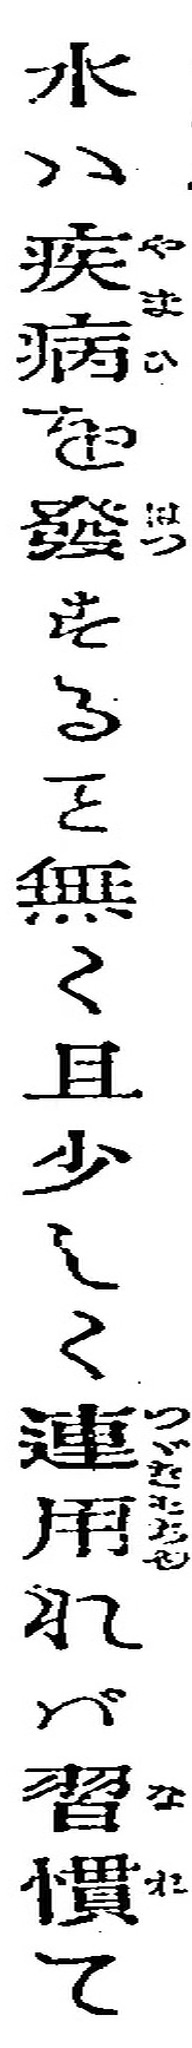水は疾病を發すること無く且少しく連用れば習慣て
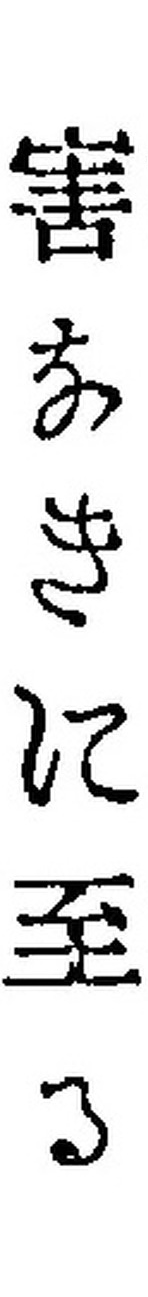害なきに至る
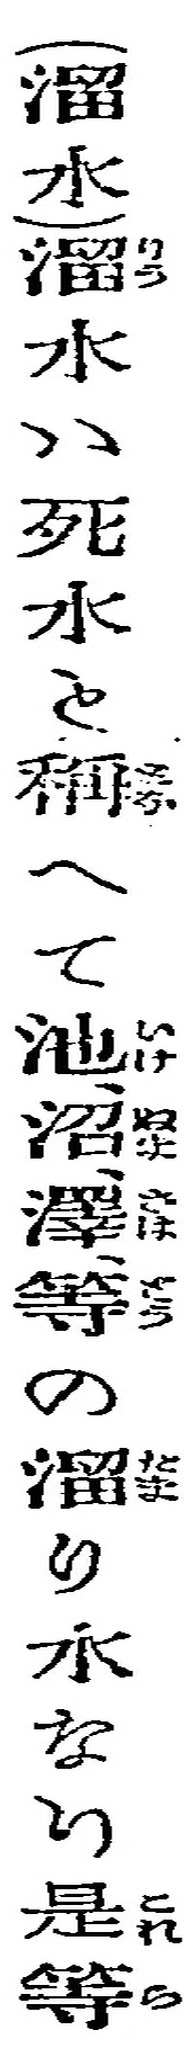[溜水]溜水は死水と稱へて池、沼、澤、等の溜り水なり是等

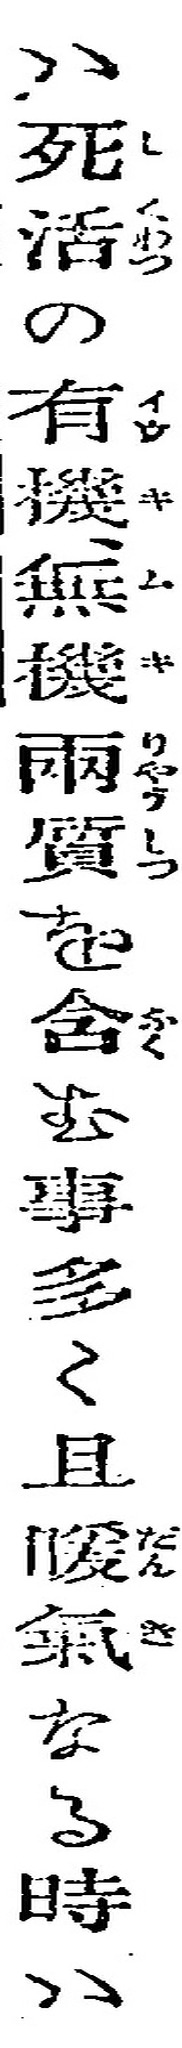は死活の有機、無機両質を含む事多く且暖気なる時は
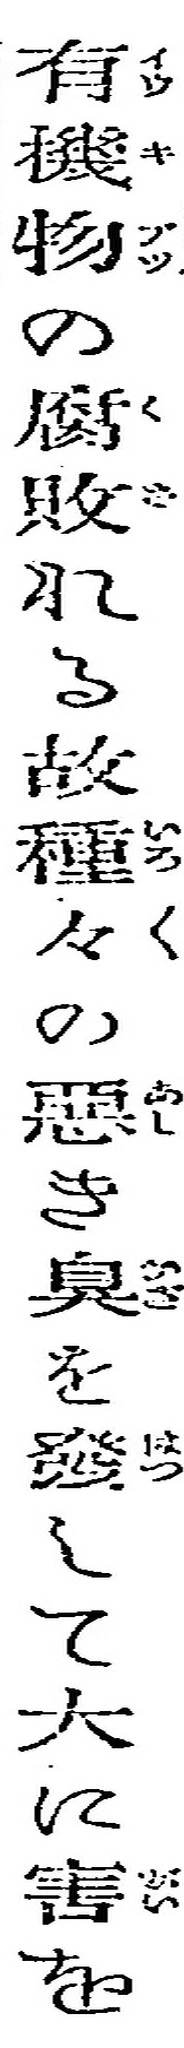有機物の腐敗れる故種々の惡き臭を發して大んい害を
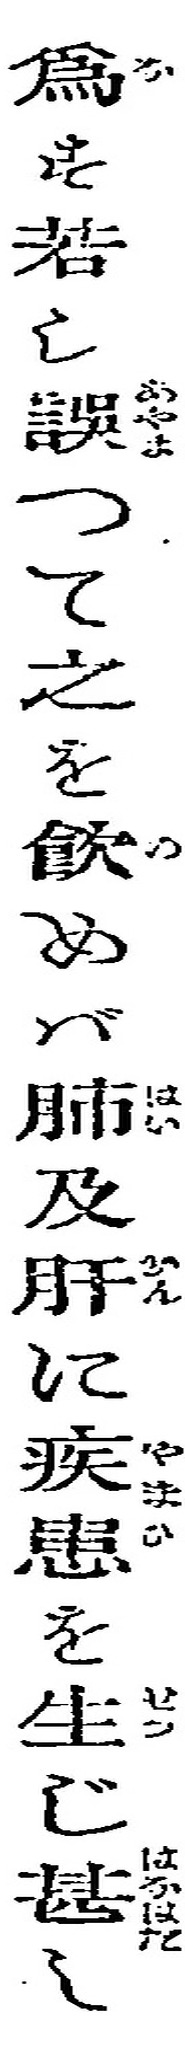為す若し誤つて之を飲めば肺及肝に疾患を生じ甚し
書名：飲水の心得 : 伝染病の予防
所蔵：国立国会図書館 National Diet Library, JAPAN
